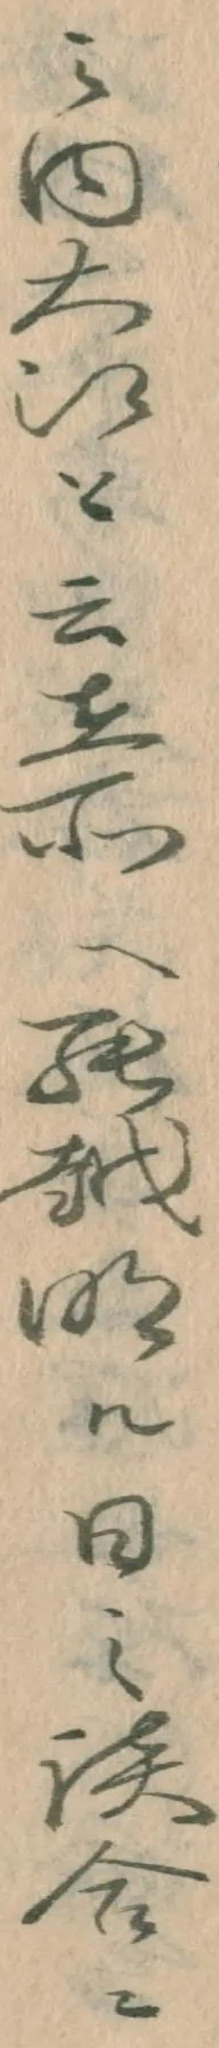之内大江と云在所へ罷越明る日之談合に
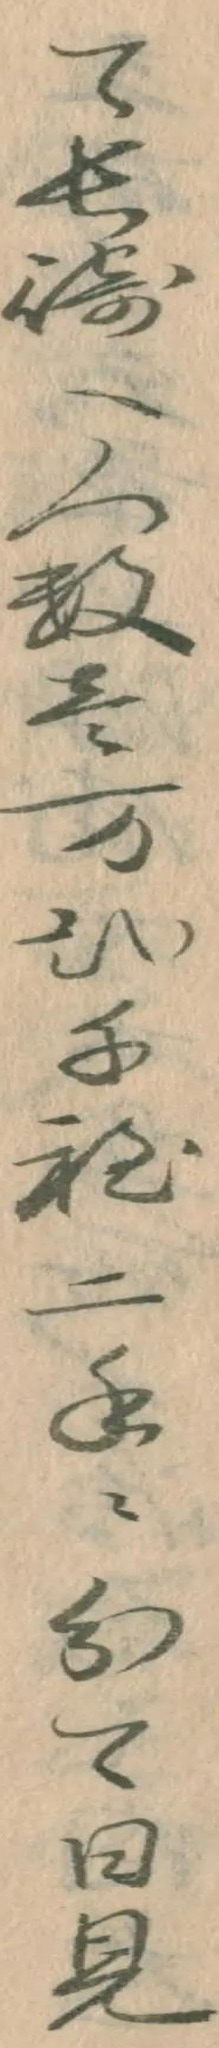て長崎へ人数壱万弐千程二手に分て日見
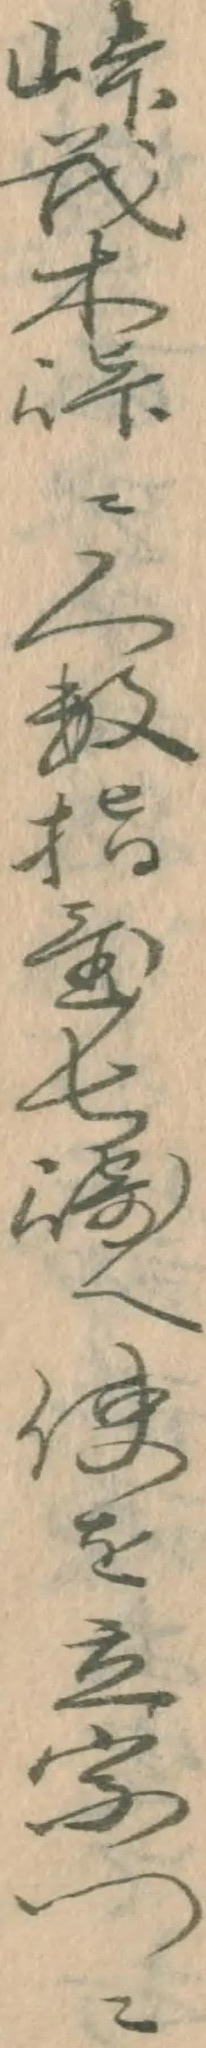峠茂木峠に人数指置七崎へ使を立宗門に
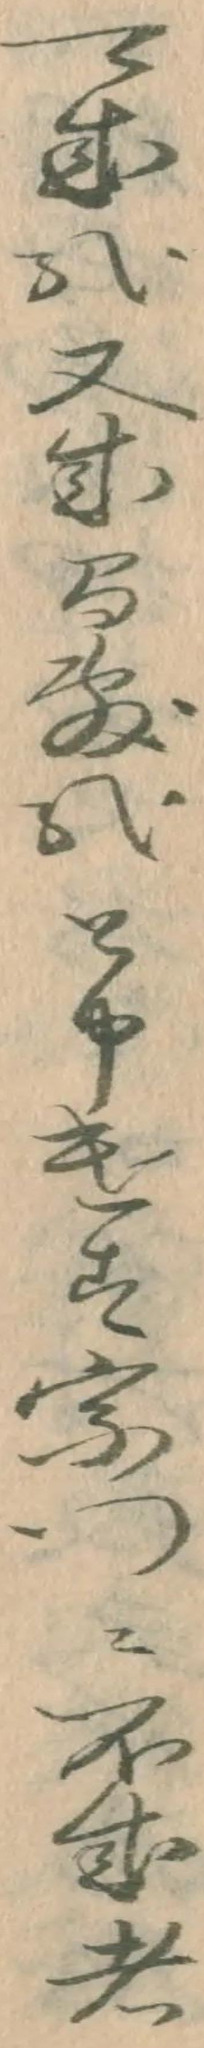可成哉又成間敷哉と申遣春宗門に不成者

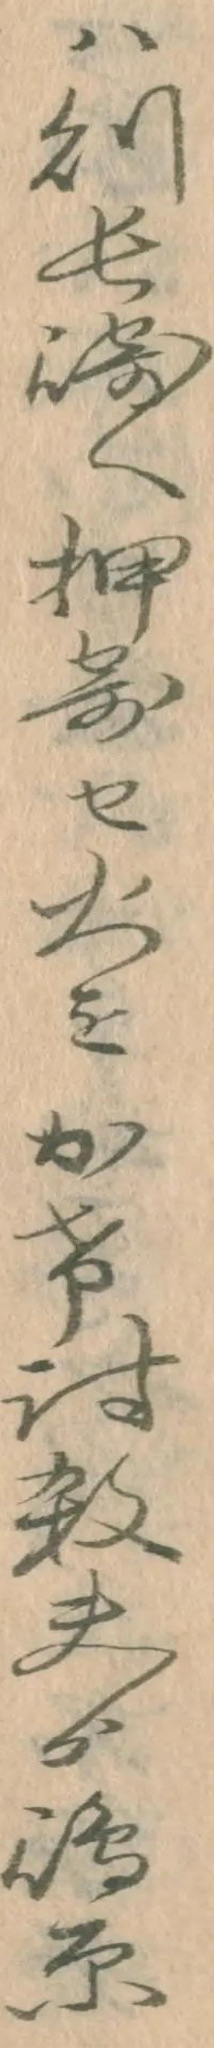は則長崎へ押寄せ火をか希討殺夫ゟ島原
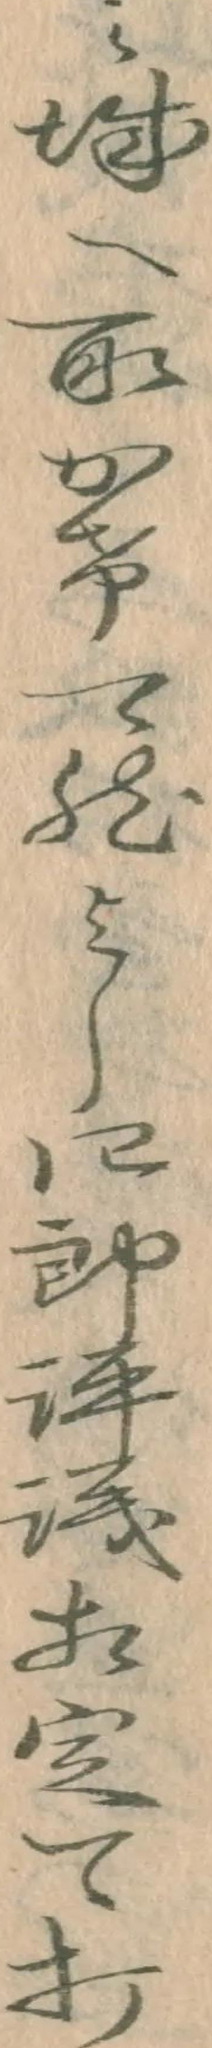之城へ取か希可然与し四郎評議相定て打
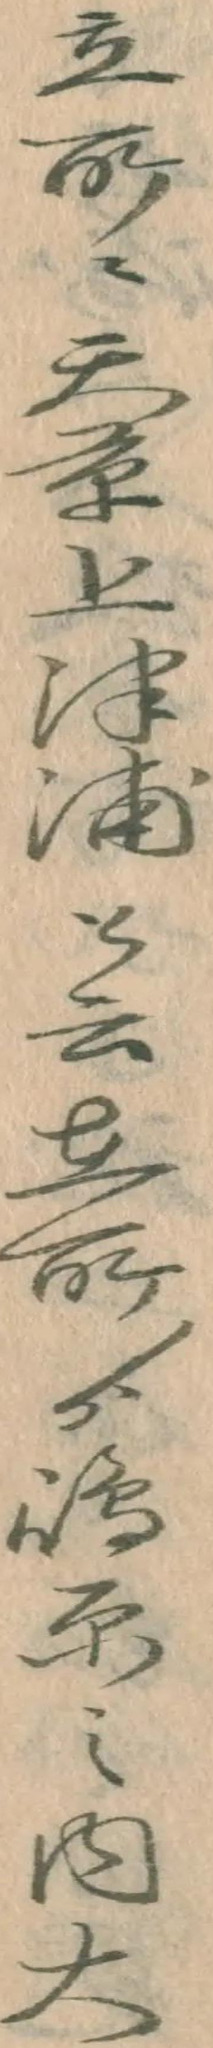立所に天草上津浦と云在所ゟ島原之内大
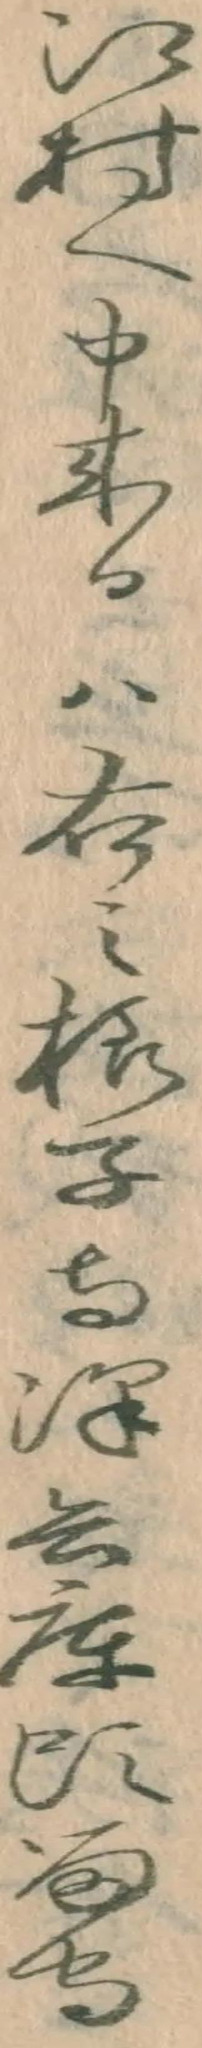江村へ申来るは右之様子寺沢兵庫頭留守
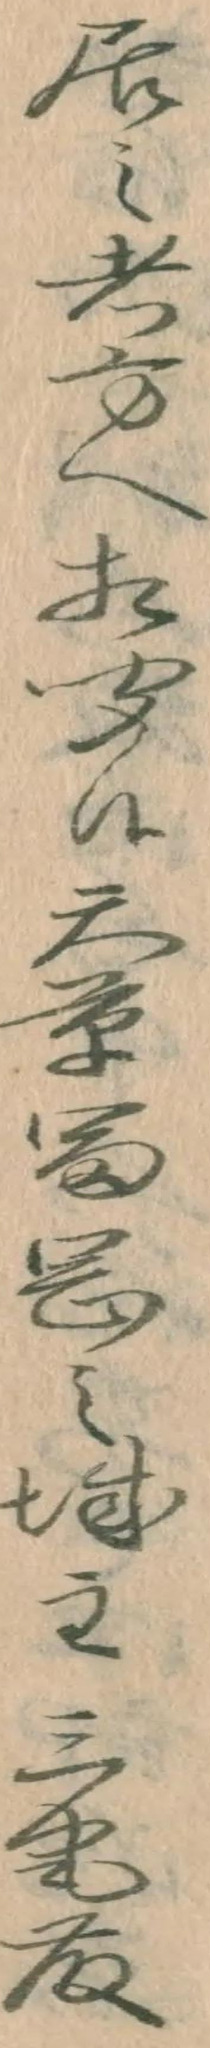居之者方へ相聞候天草冨岡之城主三宅藤
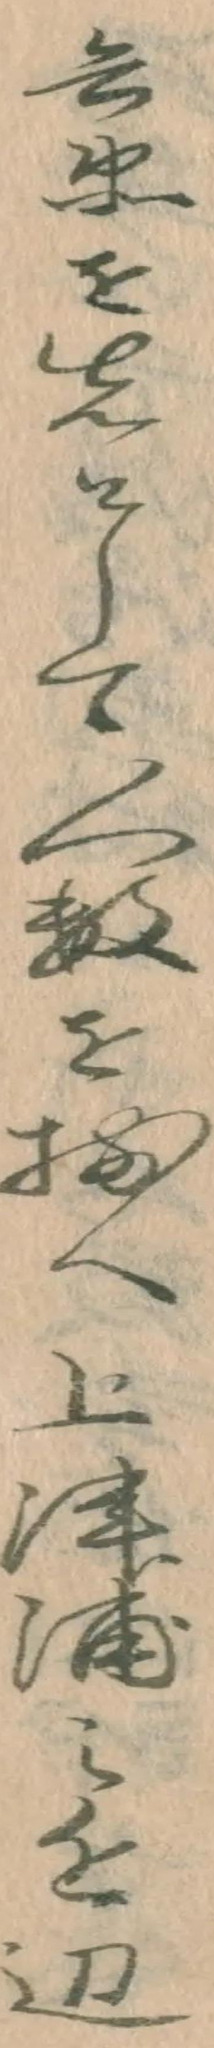兵衛を先として人数を揃へ上津浦之近辺
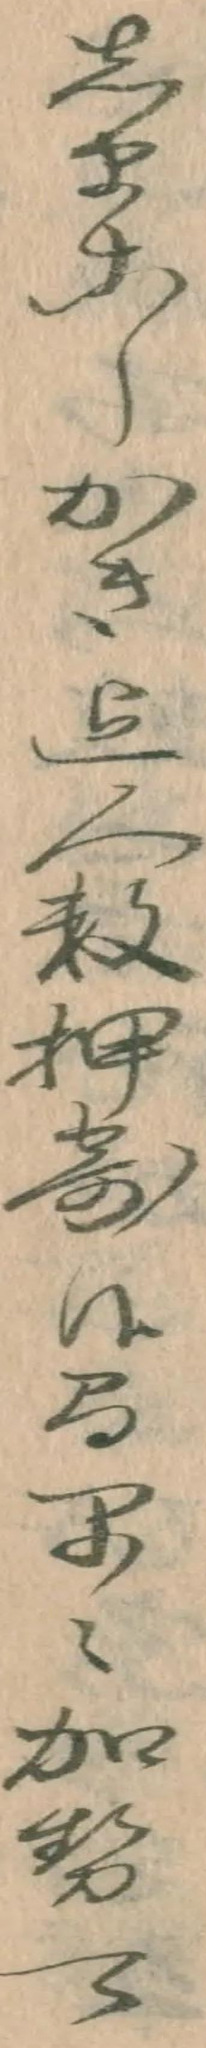先ま古しかき迄人数押寄候間早々加勢可
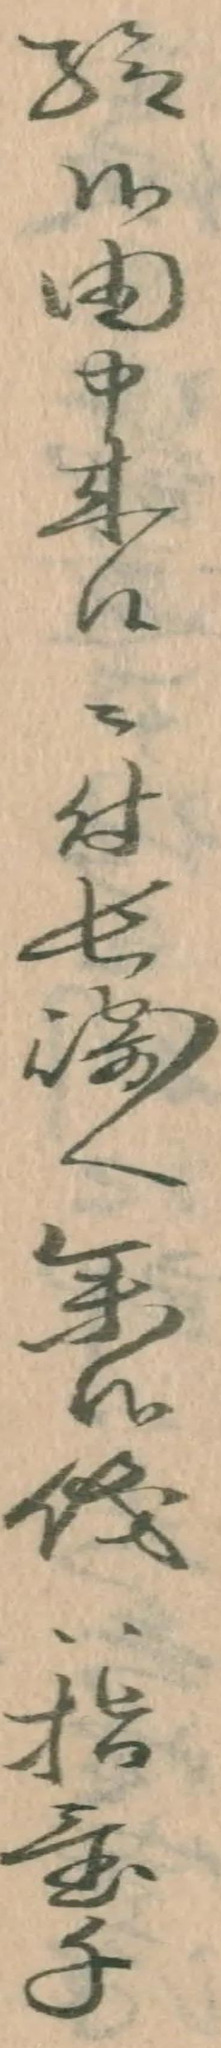給候由申来候に付長崎へ参候儀は指置千
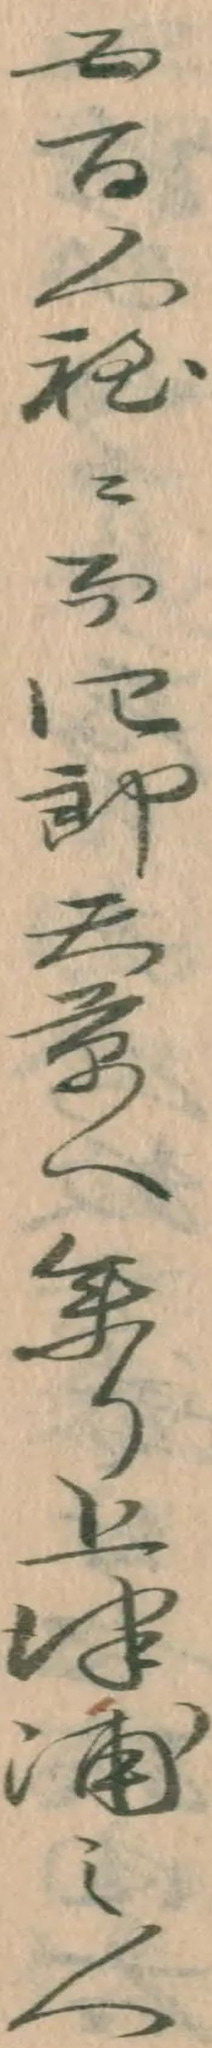五百人程に而四郎天草へ参り上津浦之人
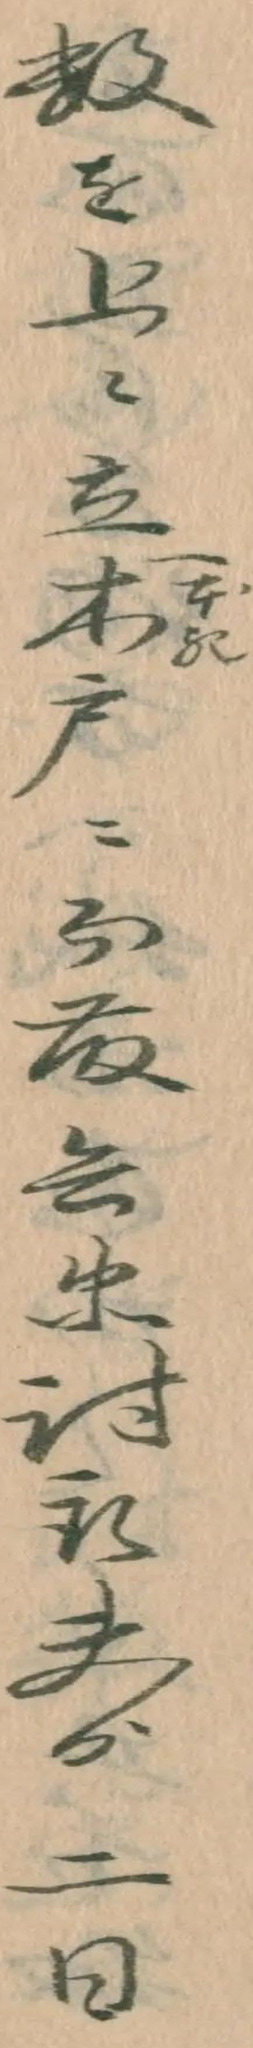数を上に立木戸に而藤兵衛討取夫ゟ二日
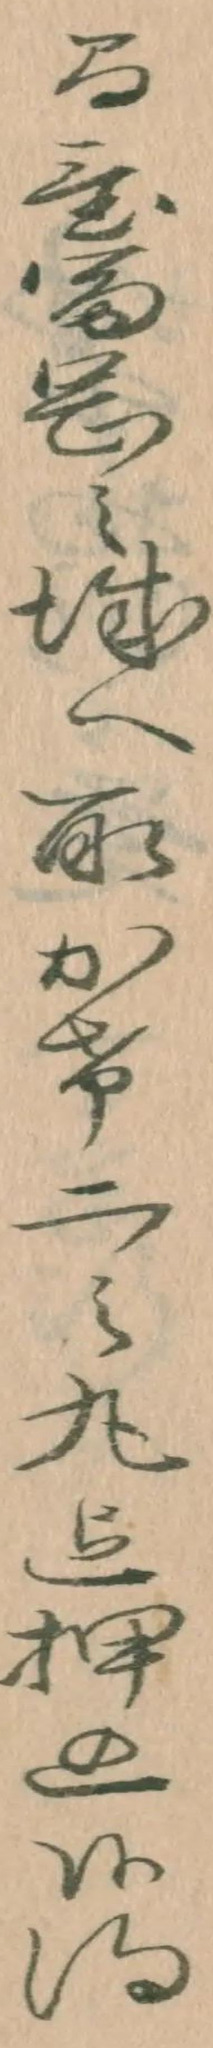間置冨岡之城へ取か希二之丸迄押込候得
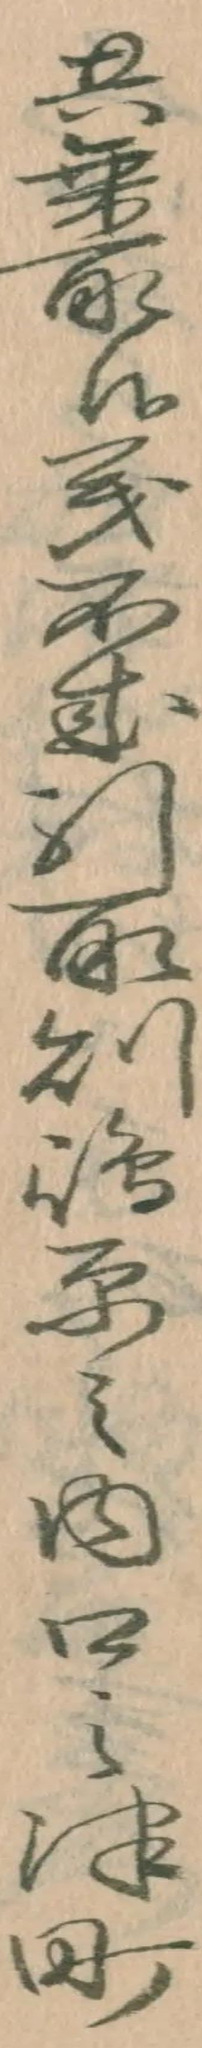共乗取候義不成引取則島原之内口之津町
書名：切支丹御退治記 49巻. [9]
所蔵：国立国会図書館 National Diet Library, JAPAN
